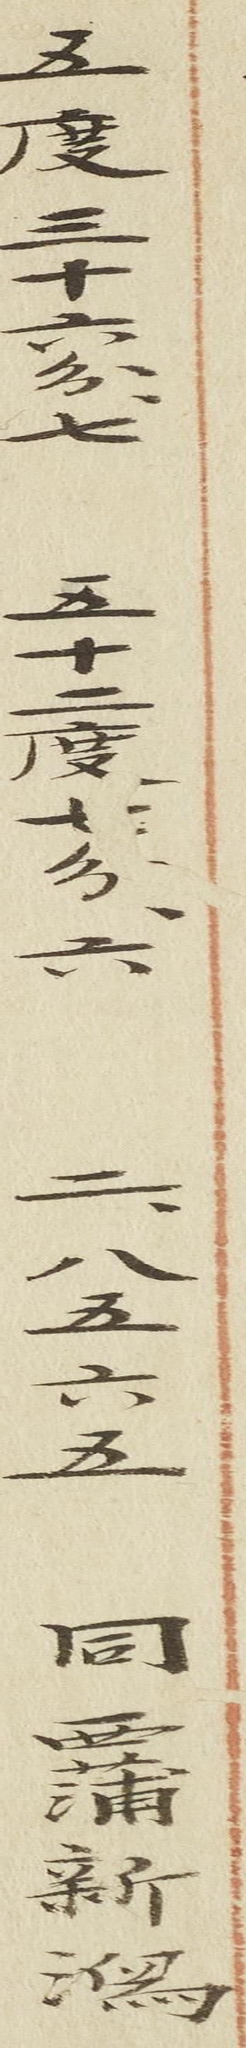五度三十六分、七五十二度七分、六二、八五六五同西蒲新潟
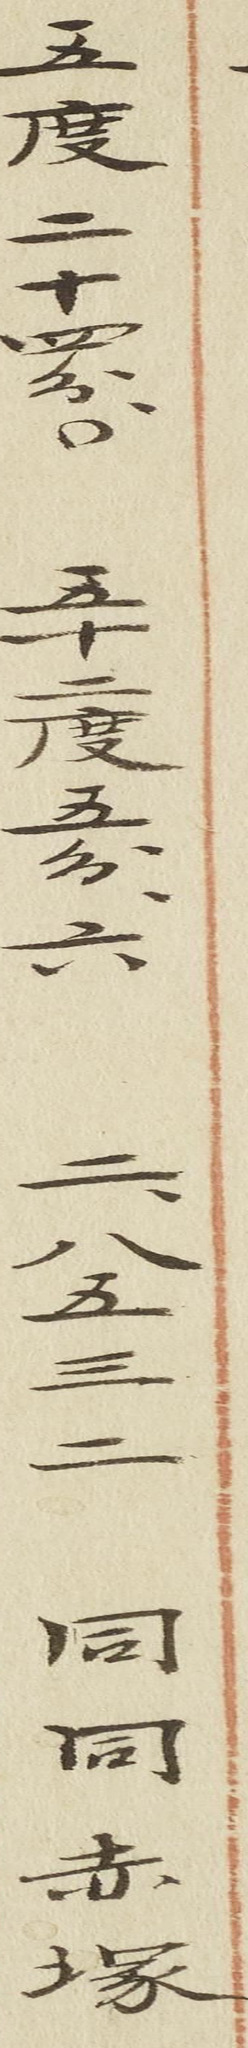五度二十四分、〇五十二度五分、六二、八五三二同同赤塚
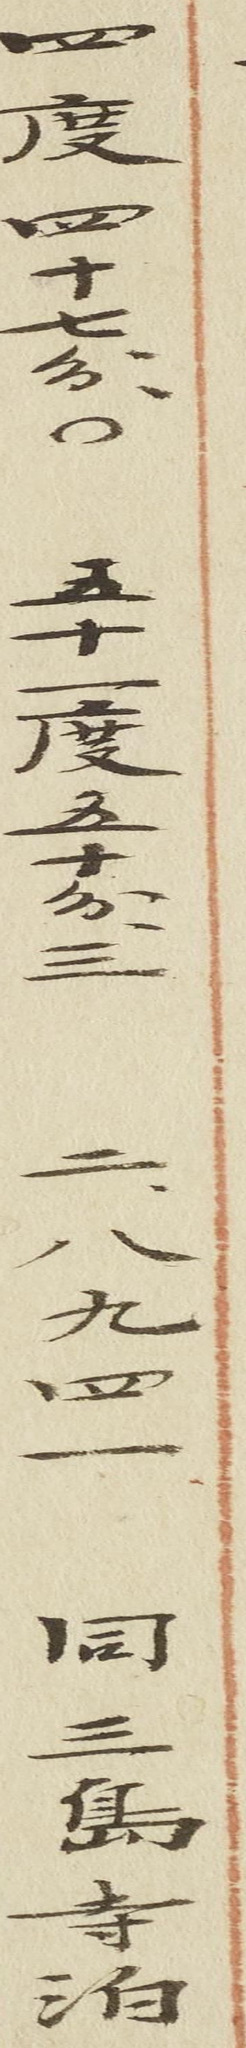四度四十七分、〇五十一度五十分、三二、八九四一同三島寺泊
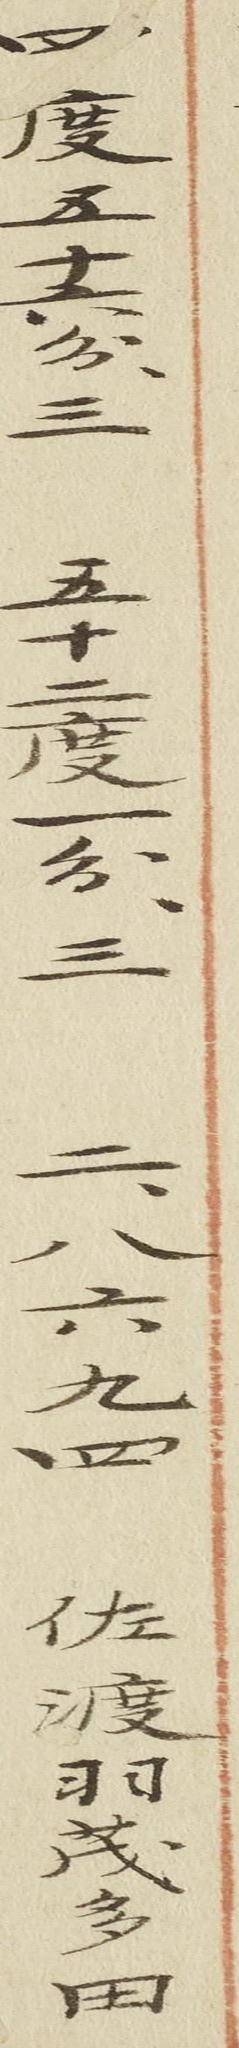四度五十六分、三五十二度一分、三二、八六九四佐渡羽茂多田
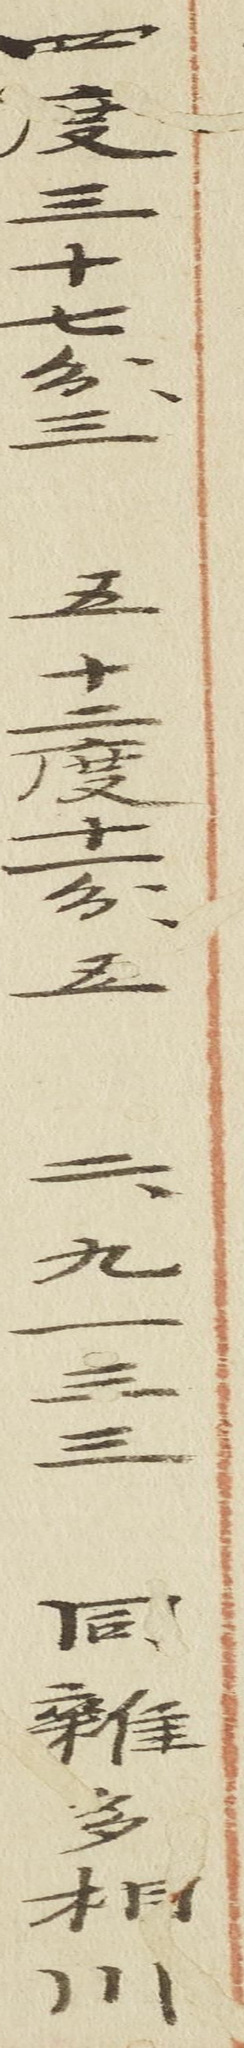四度三十七分、三五十二度十一分、五二、九一三三同雑多相川
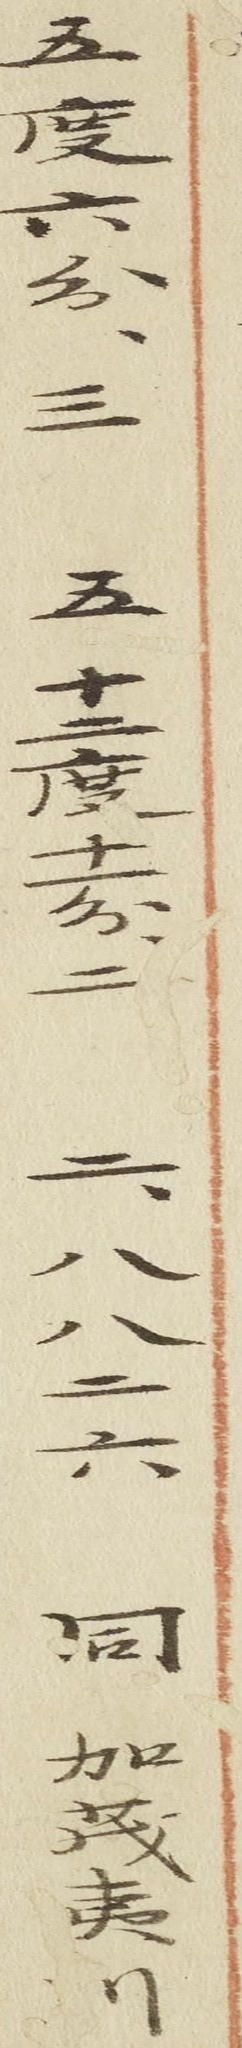五度六分、三五十二度十一分、二二、八八二六同加茂夷川
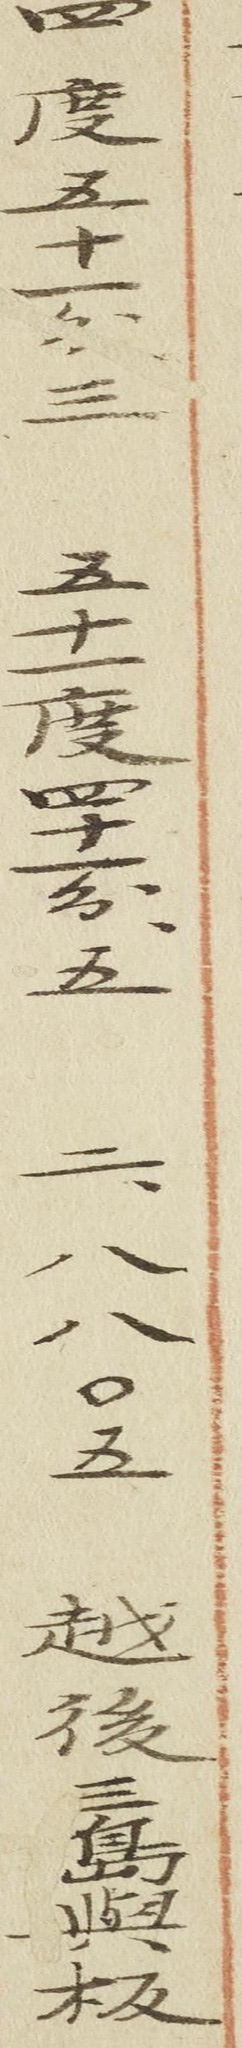四度五十一分、三五十一度四十一分、五二、八八〇五越後三島与板
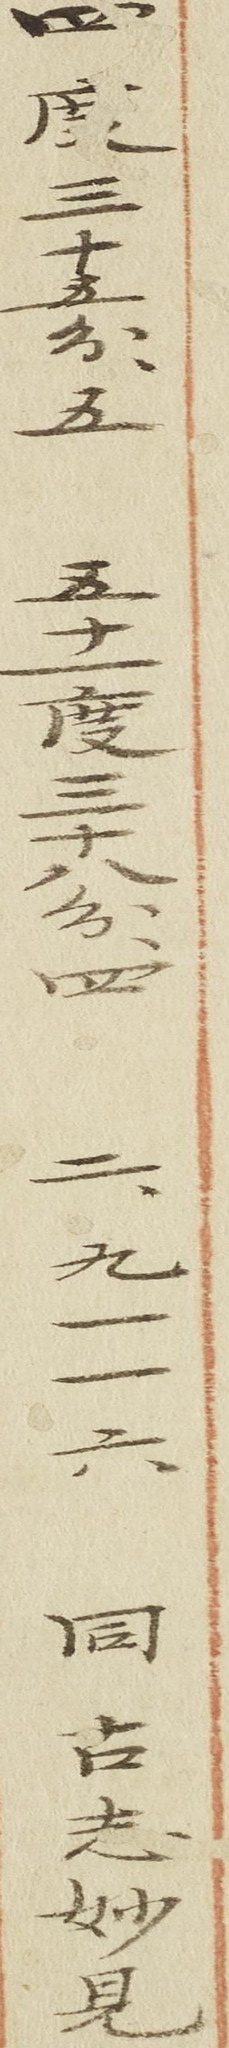四度三十五分、五五十一度三十八分、四二、九一一六同古志妙見
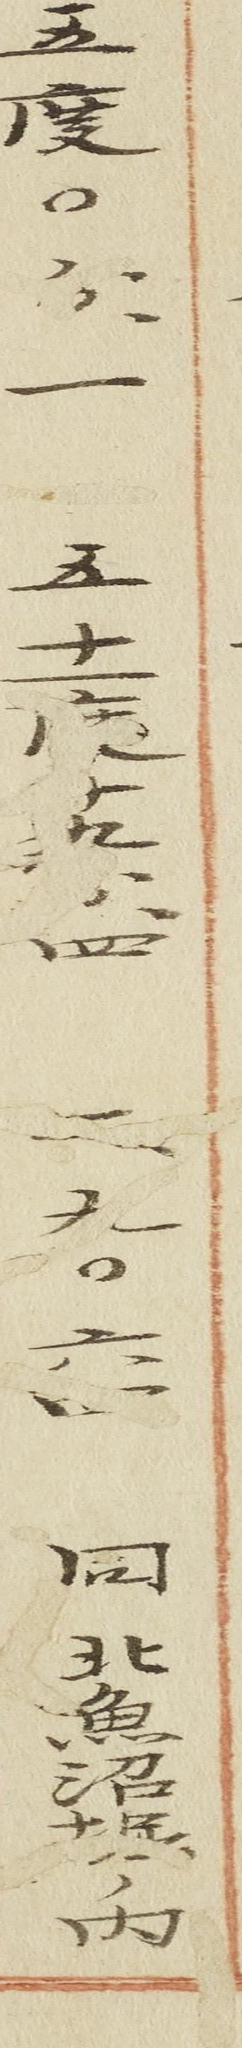五度〇分、一五十一度十九分、四二、九〇六四同北魚沼堀ノ内
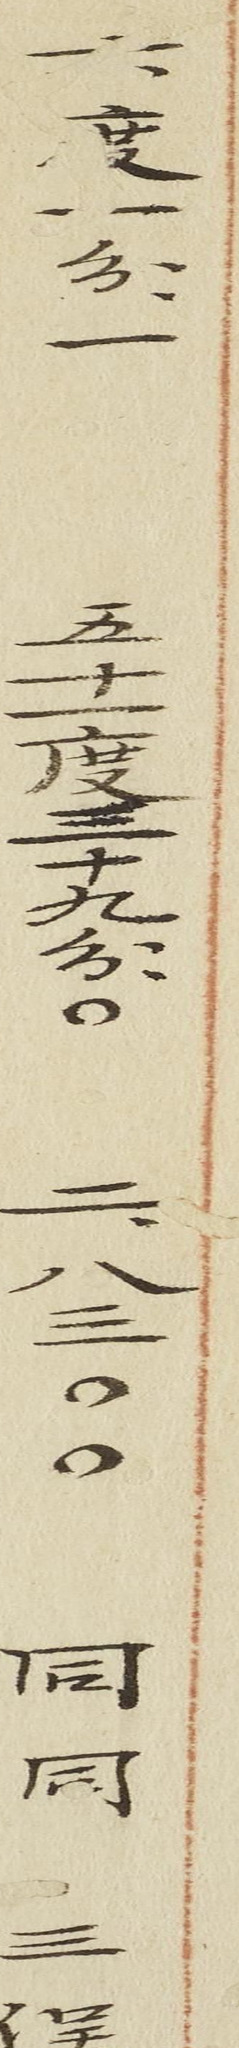六度一分、一五十一度三十九分、〇二、八三〇〇同同三俣
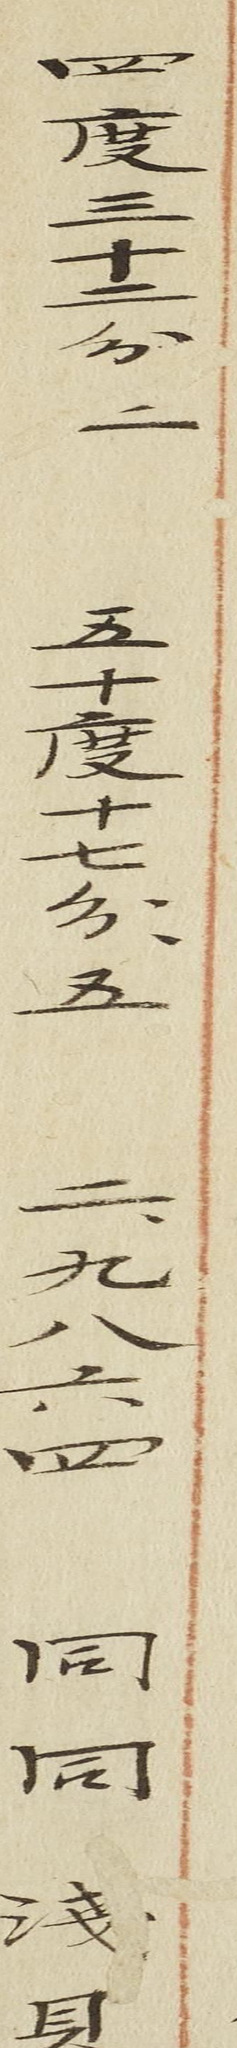四度三十二分二五十度十七分、五二、九八六四同同浅貝
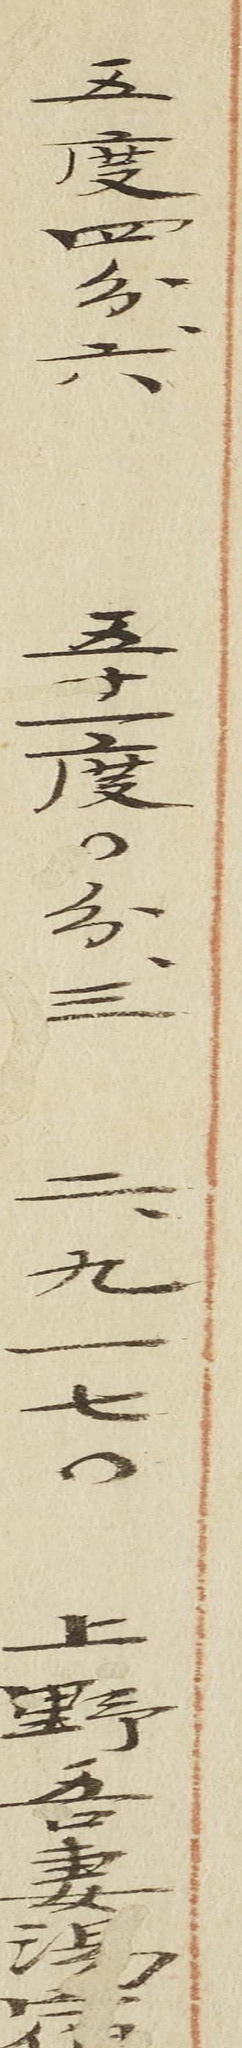五度四分、六五十一度〇分、三二、九一七〇上野吾妻湯宿
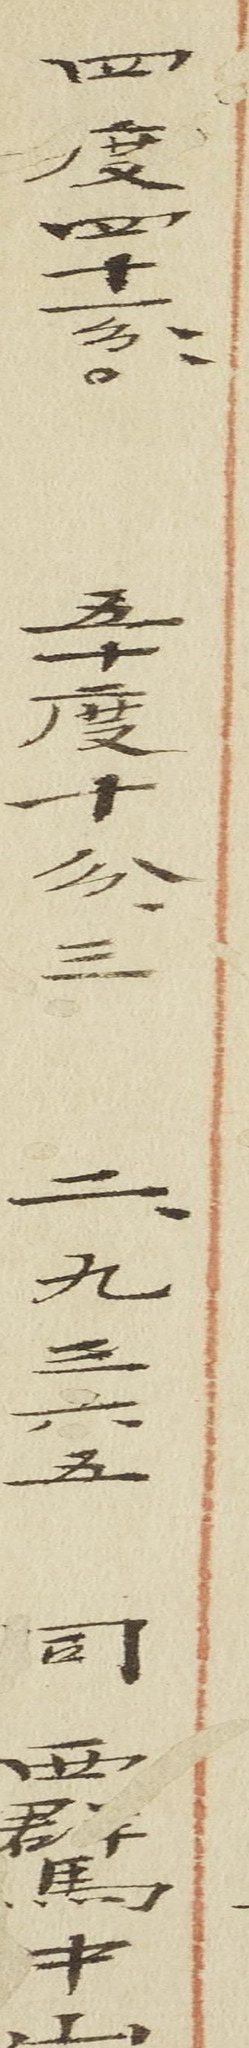四度四十一分、〇五十度十分、三二、九三六五同西群馬中山
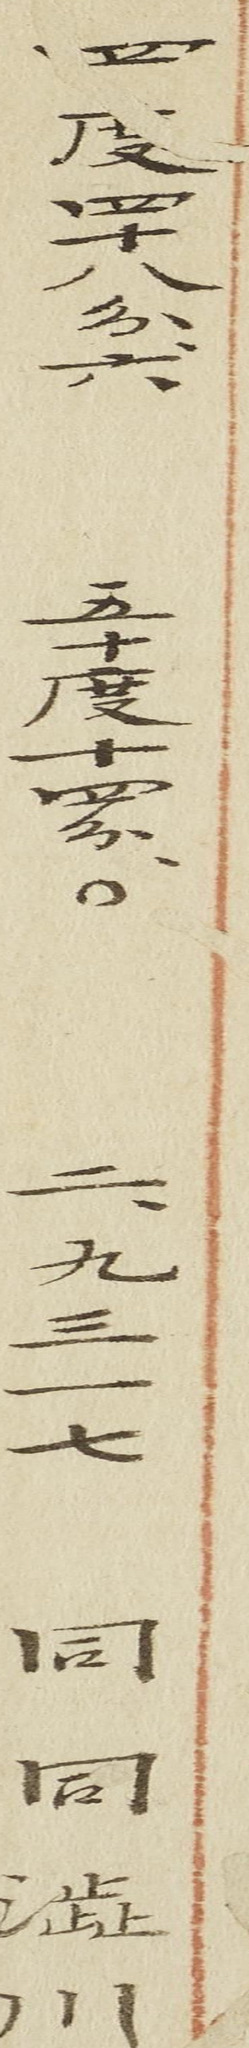四度四十八分、六五十度十四分、〇二、九三一七同同渋川
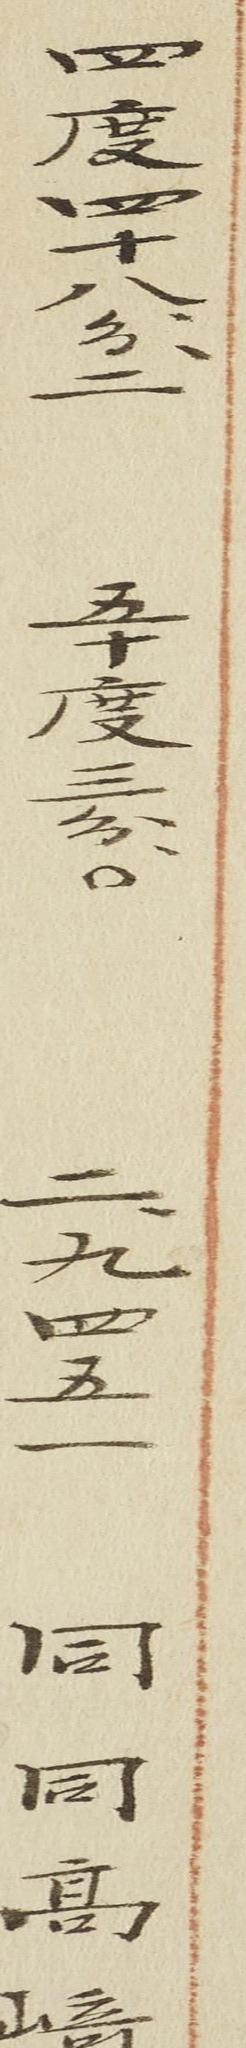四度四十八分、二五十度三分、〇二、九四吾一同同高崎
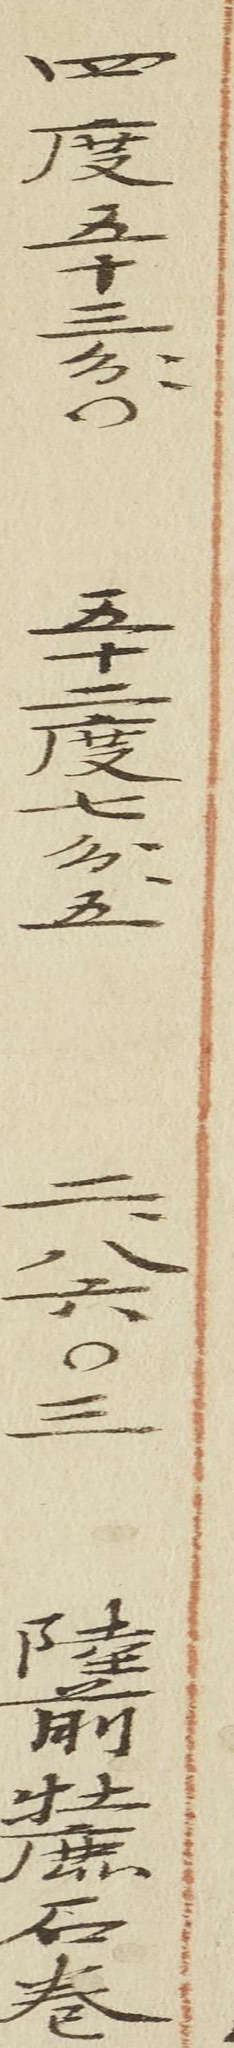四度五十三分、〇五十二度七分、五二、八六〇三陸前牡鹿石巻
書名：鑷力観測報告
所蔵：東京大学地震研究所図書室 Earthquake Research Institute Library, The University of Tokyo, JAPAN
